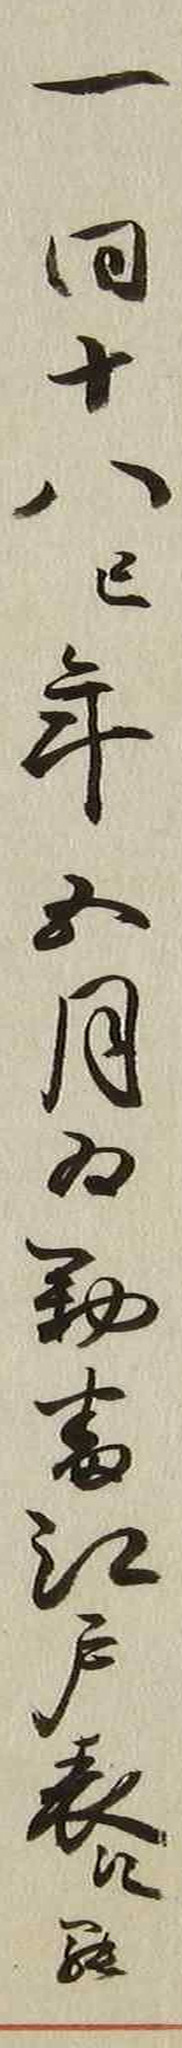一同十八巳年五月為勤番江戸表江罷
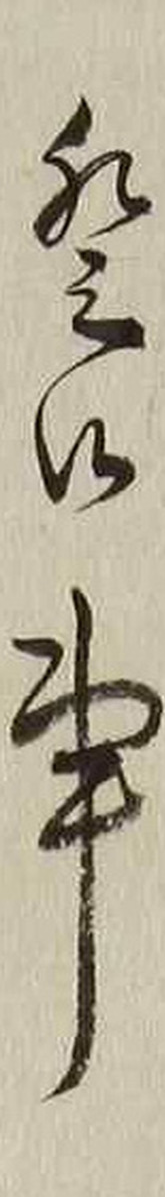登候事
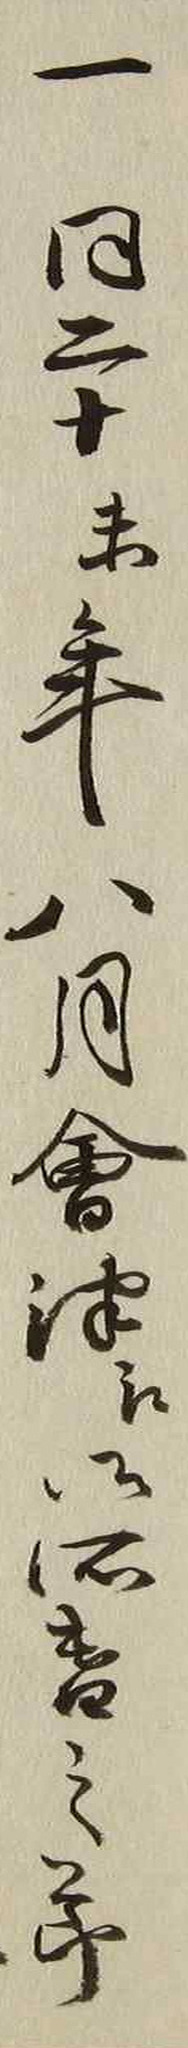一同二十未年八月会津江御所替之節
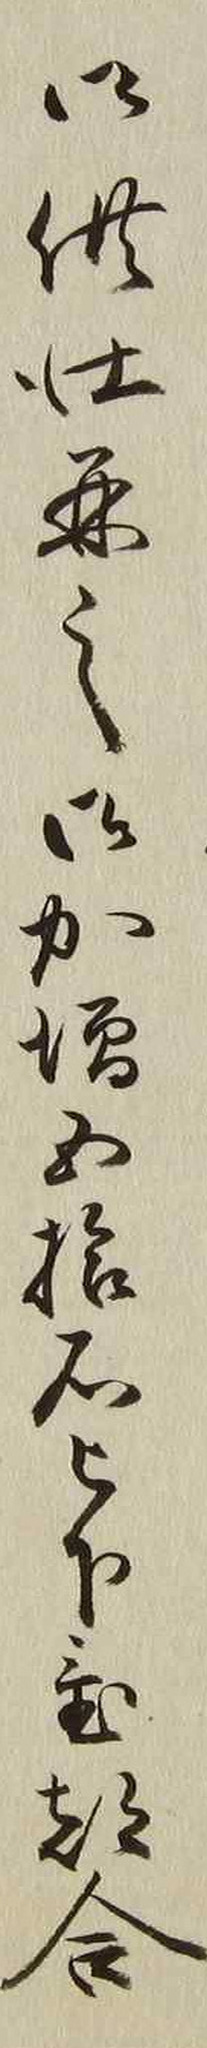御供仕並之御加増五拾石被下置都合
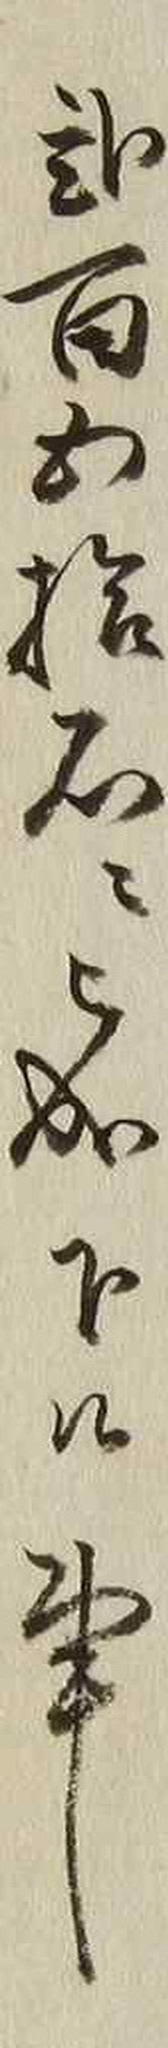弐百五拾石ニ被成下候事
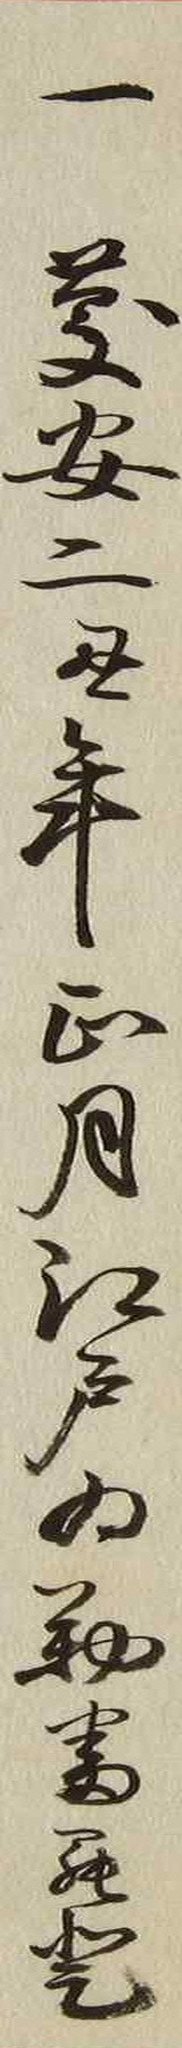一慶安二丑年正月江戸為勤番罷登
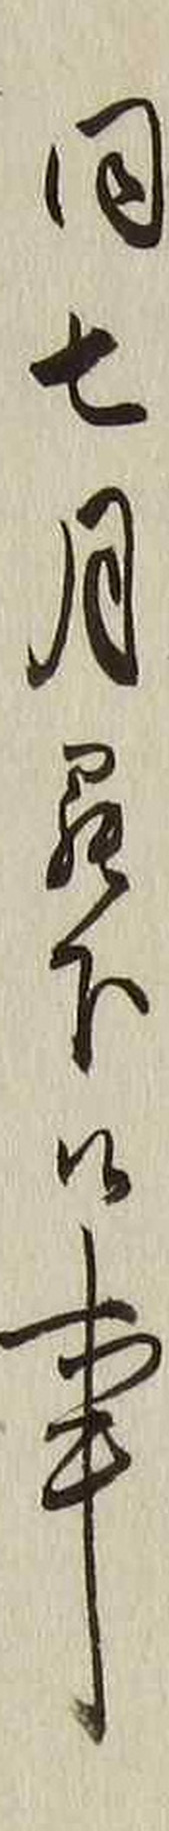同七月罷下候事
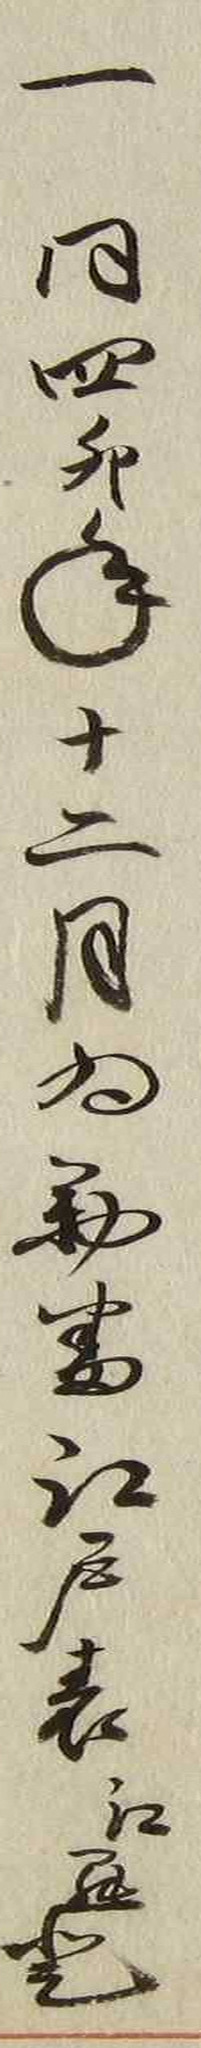一同四卯年十二月為勤番江戸表江罷登
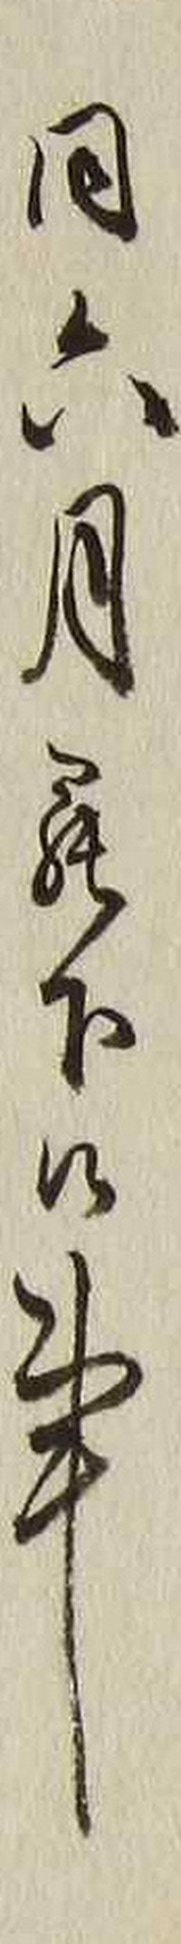同六月罷下候事
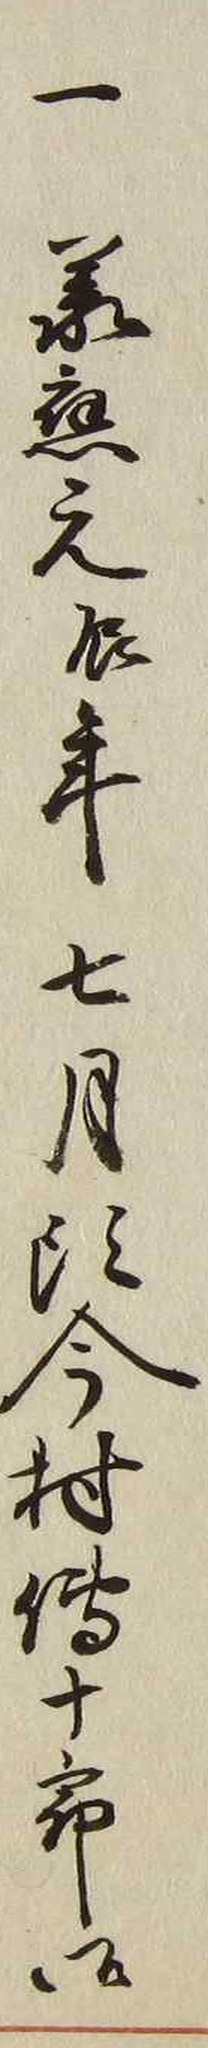一承応元辰年七月頭今村伝十郎御
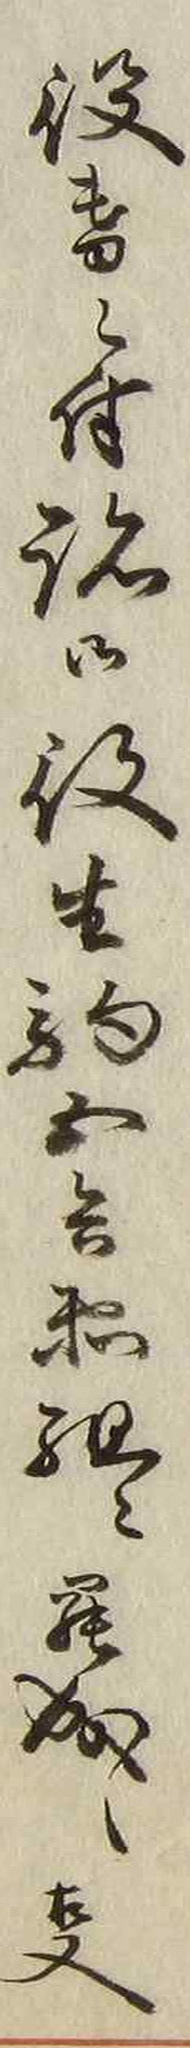役替ニ付跡御役生駒五兵衛組ニ罷成候事
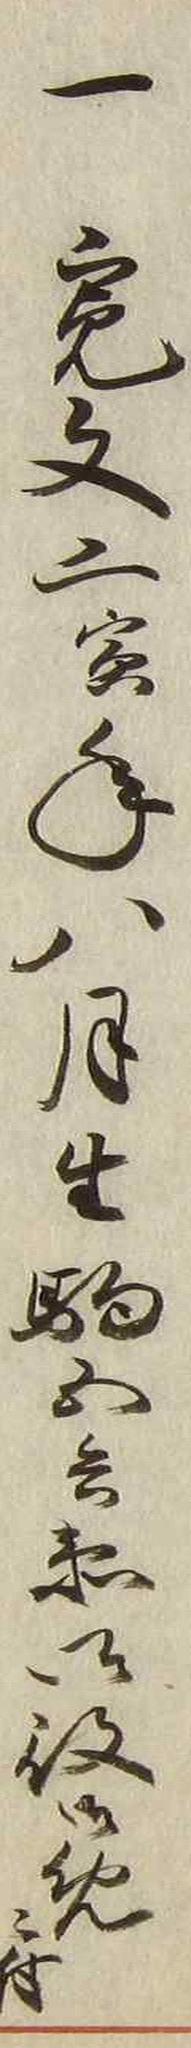一寛文二寅年八月生駒五兵衛御役御免ニ付

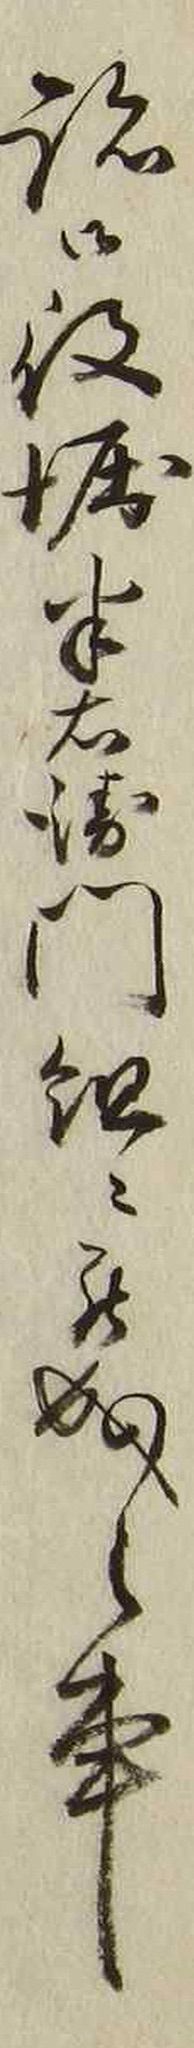跡御役堀半右衛門組ニ罷成候事
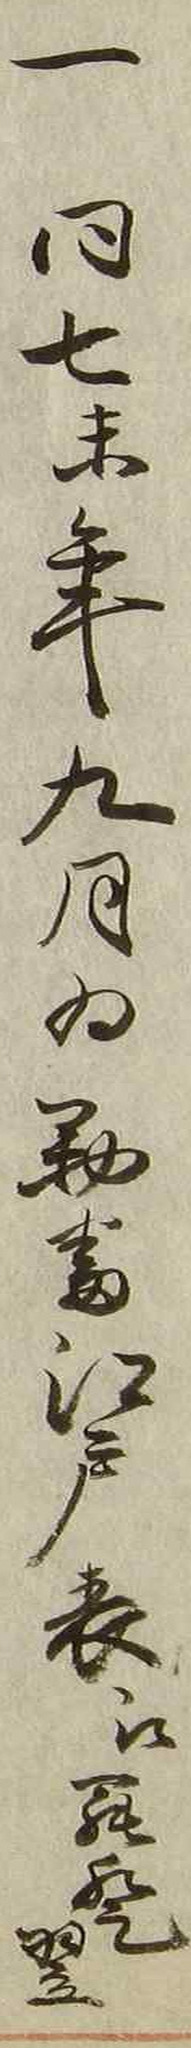一同七未年九月為勤番江戸表江罷登翌
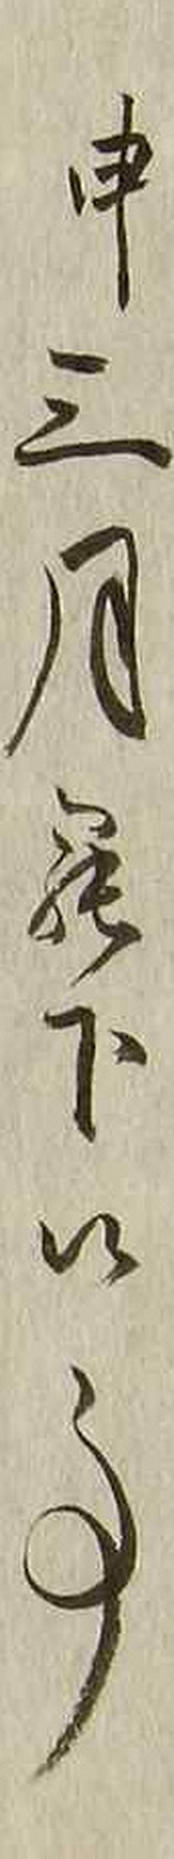申三月罷下候事
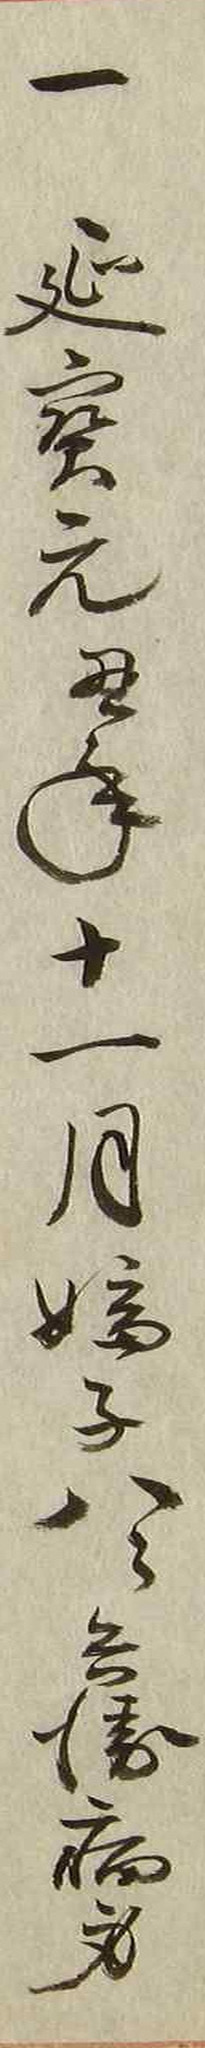一延宝元丑年十一月嫡子八郎兵衛病身
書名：諸士系譜　巻之15　い之部15
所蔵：会津若松市立会津図書館
